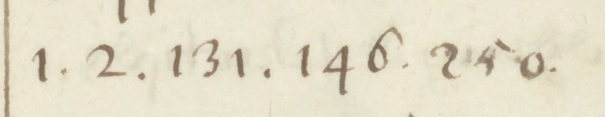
1. 2. 131. 146. 250.
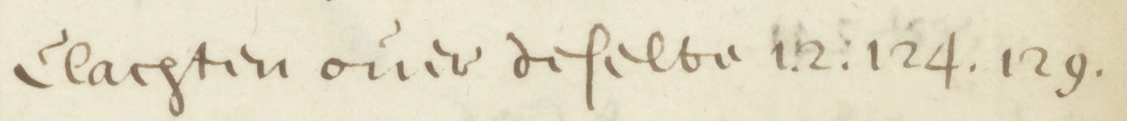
Clachten ouer deselve 12. 124. 129.
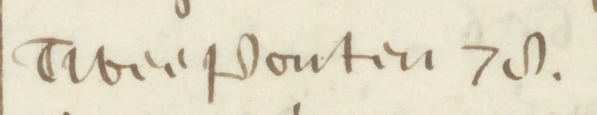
Twee Ponten 78.
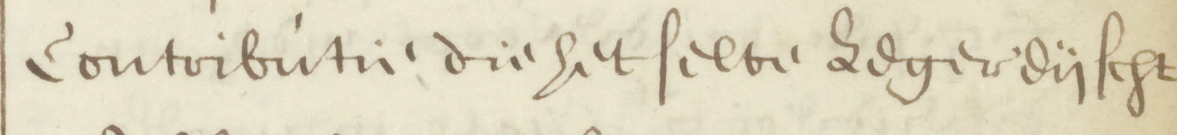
Contributie die het selve Leger eijscht
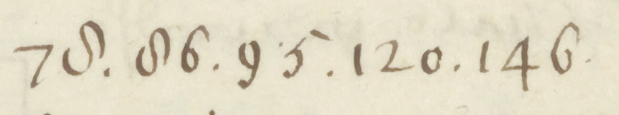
78. 86. 95. 120. 146.
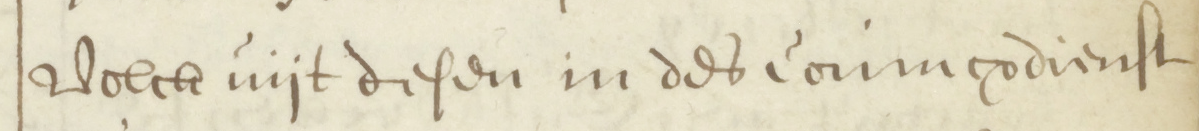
Volck uijt desen in des Conincx dienst
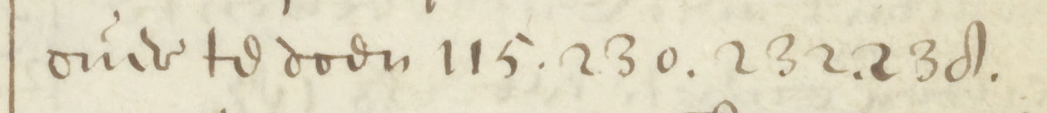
ouer te doen 115. 230. 232. 238.
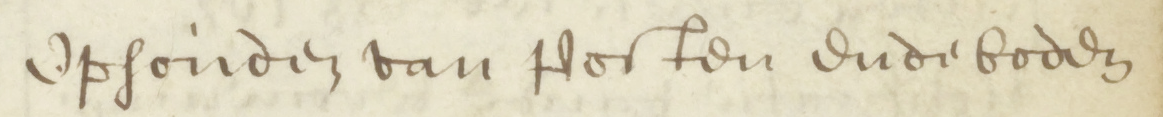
Ophouden van Posten ende boden
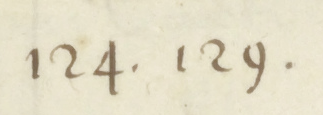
124. 129.
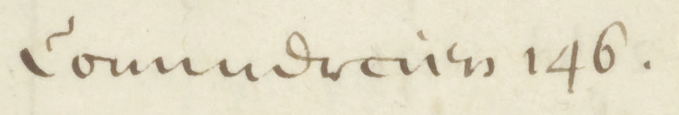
Commercien 146.
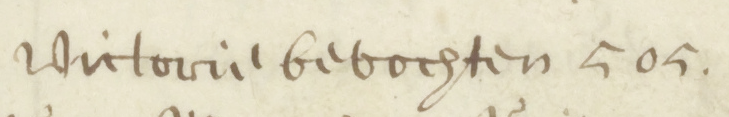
Victorie bevochten 505.
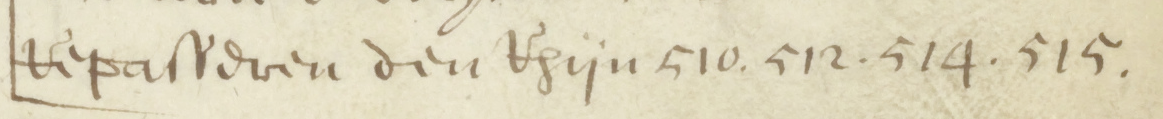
Repasseren den Rhijn 510. 512. 514. 515.
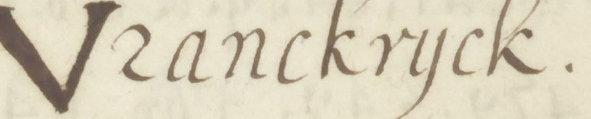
Vranckrijck.
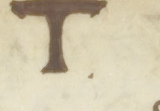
T.
